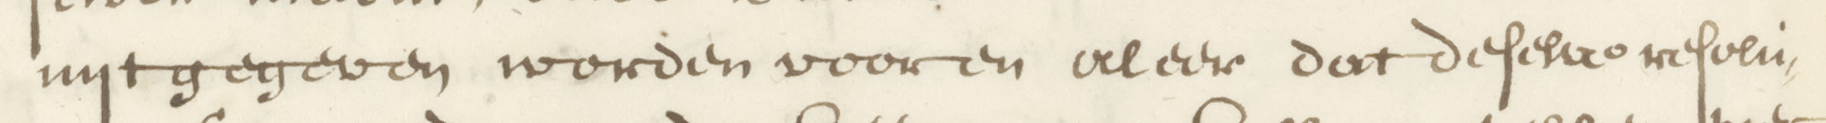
uytgegeven worden vooren aleer dat deselve resolu„
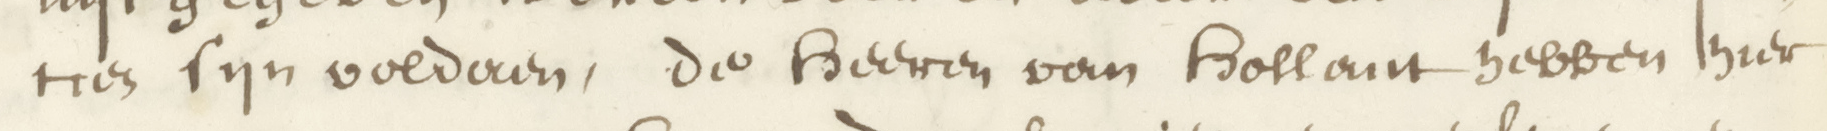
tien syn voldaen. de Heeren van Hollant hebben hier
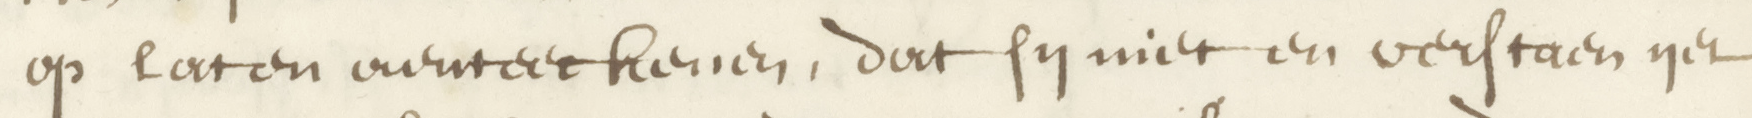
op laten aenteeckenen, dat sy niet en verstaen yet
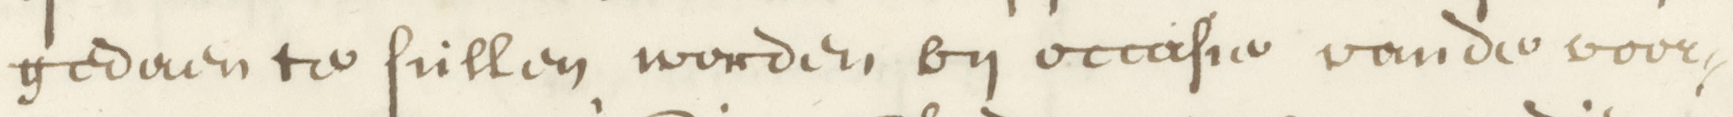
gedaen te sullen worden by occasie vande voor„
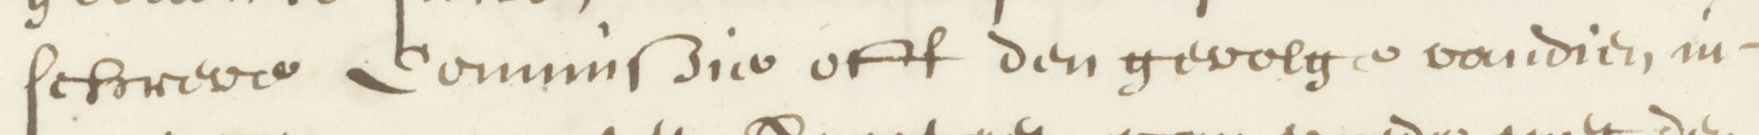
schreve Commissie off den gevolge vandien in
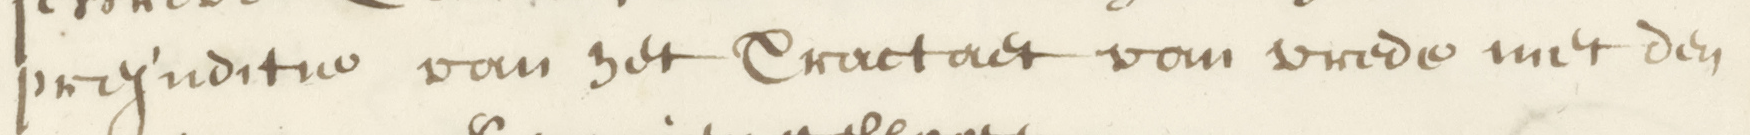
prejuditie van het Tractaet van vrede met den
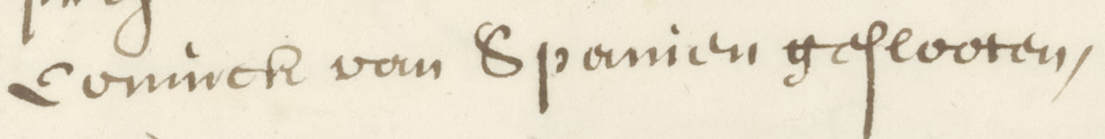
Coninck van Spanien geslooten.
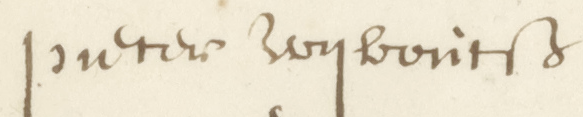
Pieter Wybouts
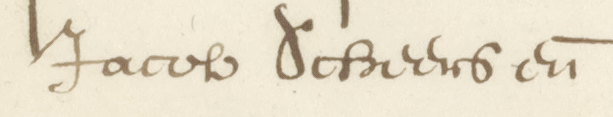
Jacob Scheers en
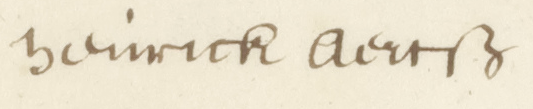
henrick Aerts
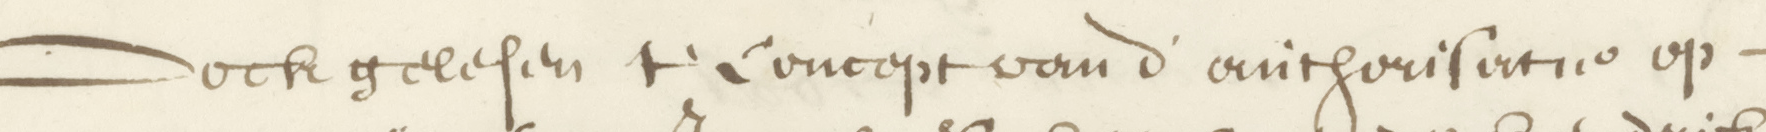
Oock gelesen t' Concept van d'authorisatie op
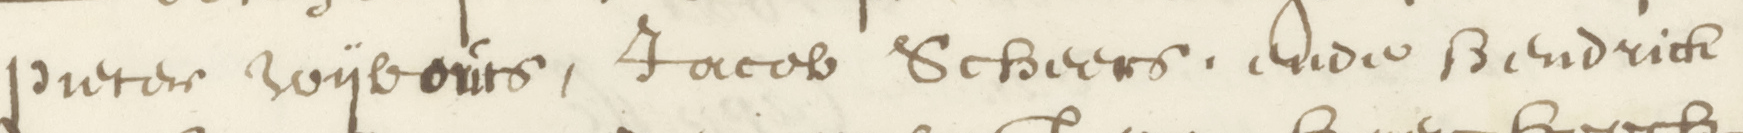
pieter Wijbouts, Jacob Scheers, ende Hendrick
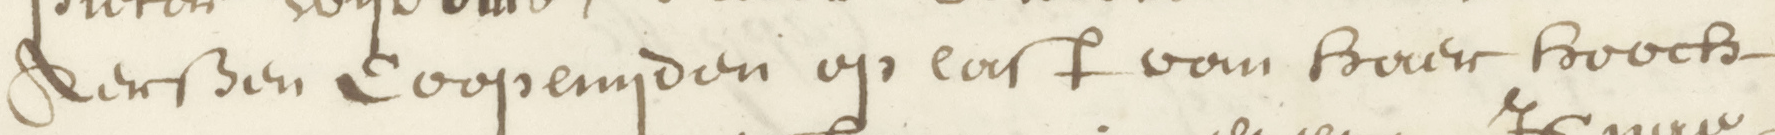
Aerssen Coopluyden op last van Haer Hooch
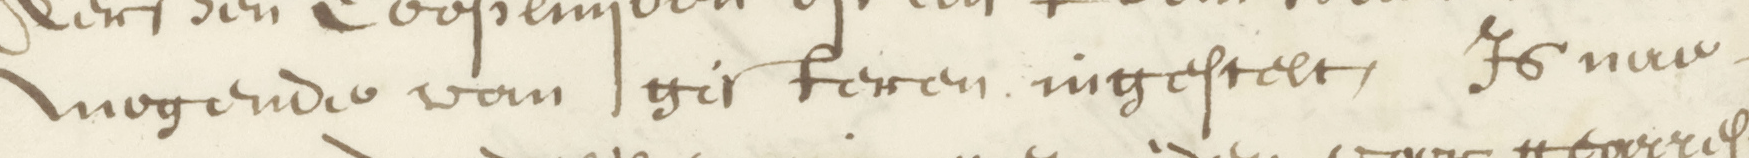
Mogende van gisteren ingestelt. Is nae
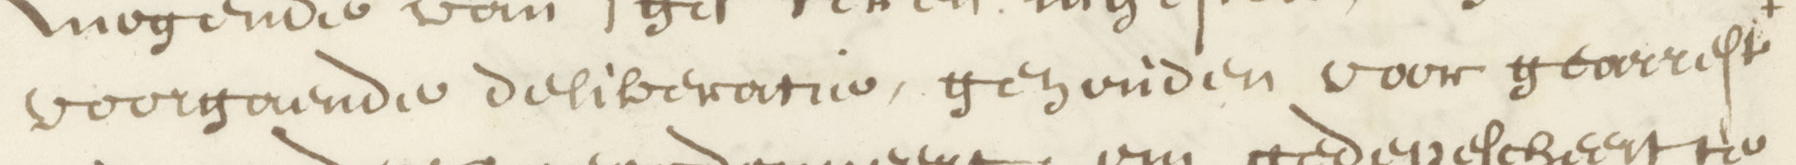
voorgaende deliberatie, gehouden voor gearrestt
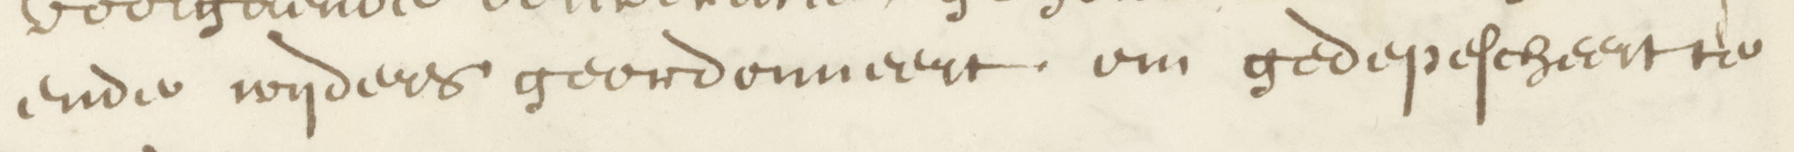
ende wyders geordonneert, om gedepescheert te
